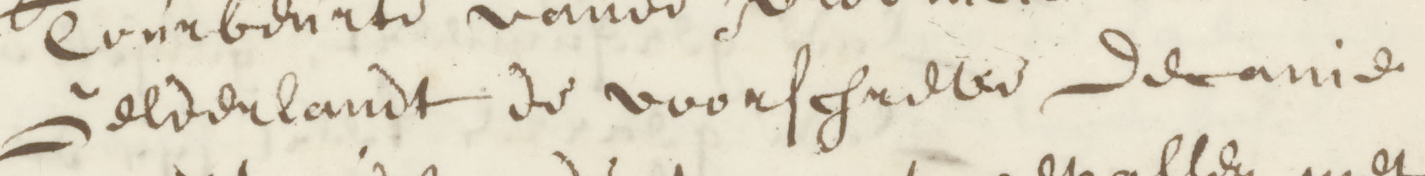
Gelderlandt de voorschreve Decanie
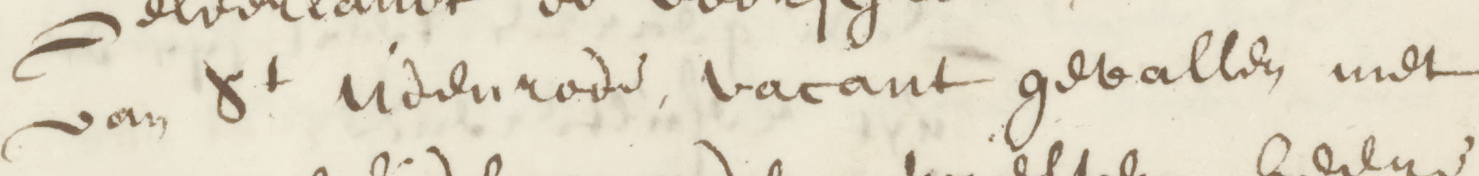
van St. Udenrode, vacant gevallen met
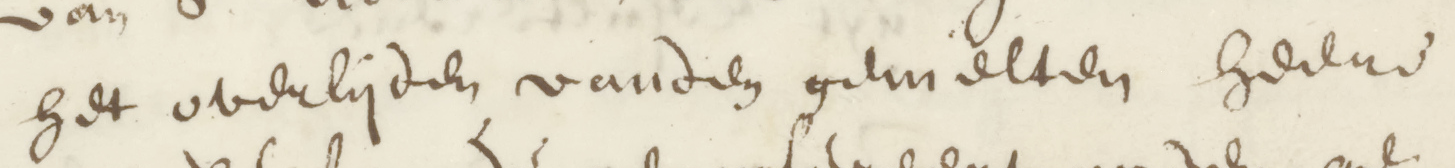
het overlijden vanden gemelten heere
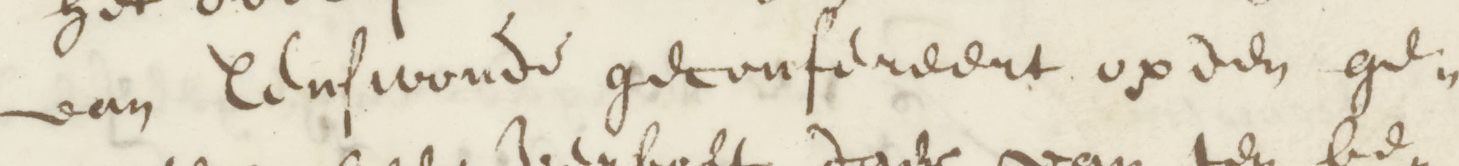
van Renswoude geconfereert, opden ge„
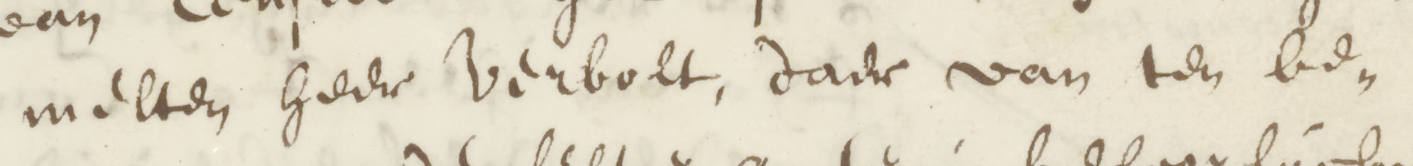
melten heer Verbolt, daer van ten be„
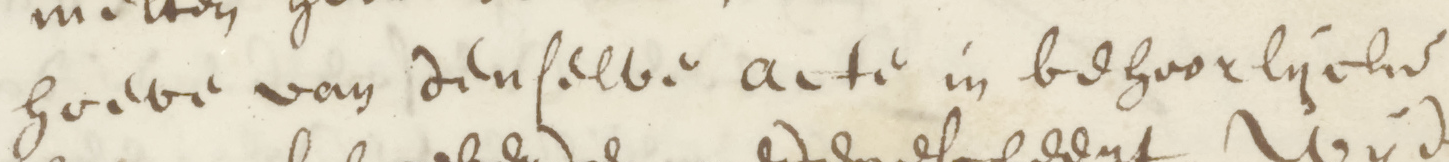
hoeve van denselve acte in behoorlijcke
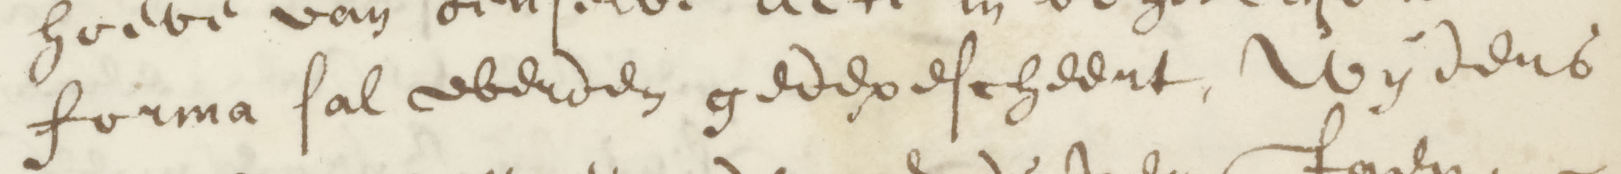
forma sal werden gedepescheert. Wijders
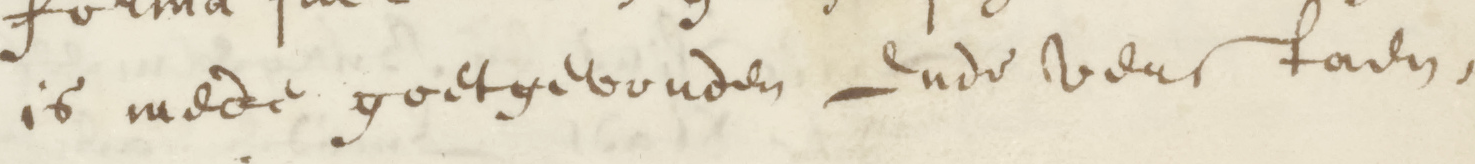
is mede goetgevonden ende verstaen,
